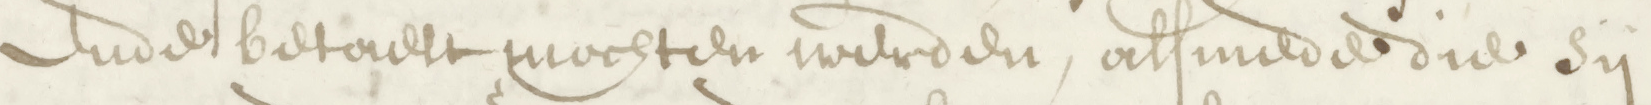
Ende betaelt mochten werden, alsmede die sij
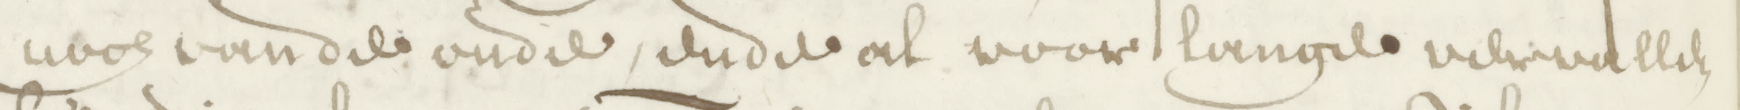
noch vande oude, ende al voor lange vervallen
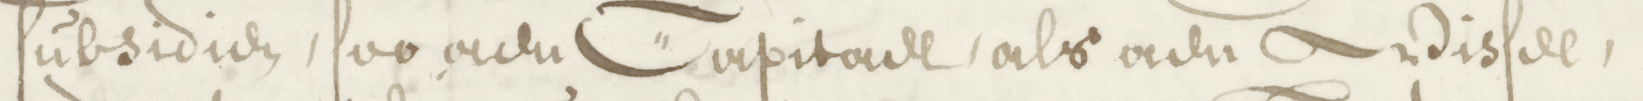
subsidien, soo aen Capitael als aen Wissel
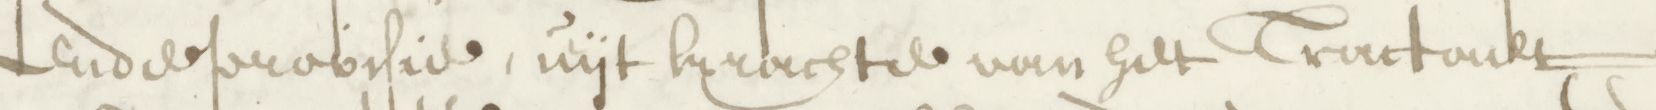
ende provisie, uijt krachte van het Tractaet
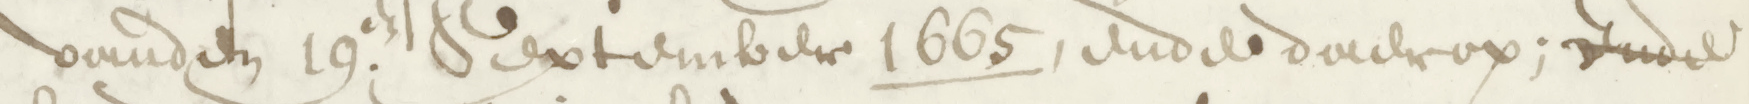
vanden 19en September 1665, ende daerop; ende
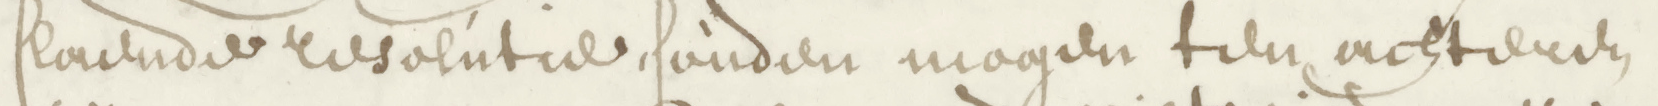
slaende resolutie souden mogen ten achteren,
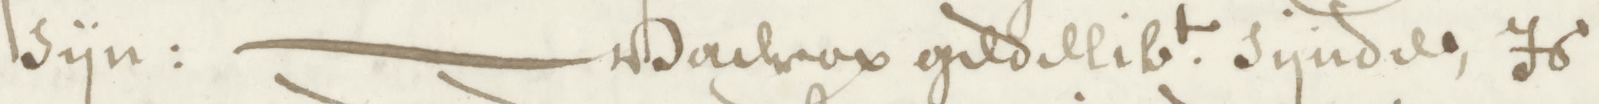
sijn: Waerop gedelibt sijnde, Is
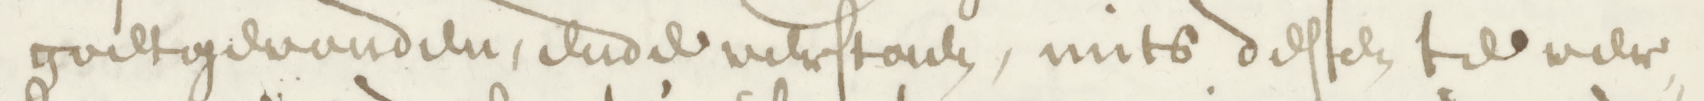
goetgevonden, ende verstaen, mits desen te ver„
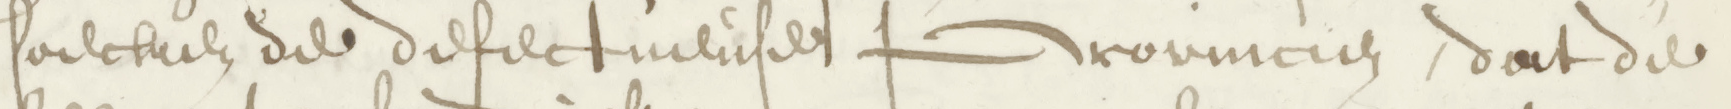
soecken de defectueuse Provincien, dat de
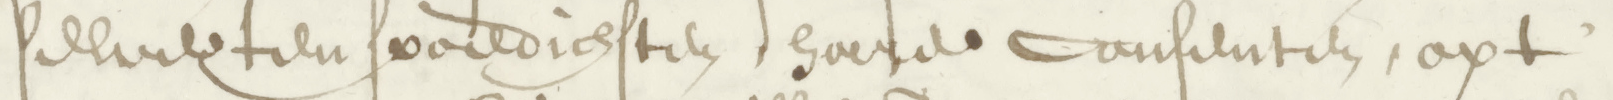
selve ten spoedichsten, hare consenten, opt
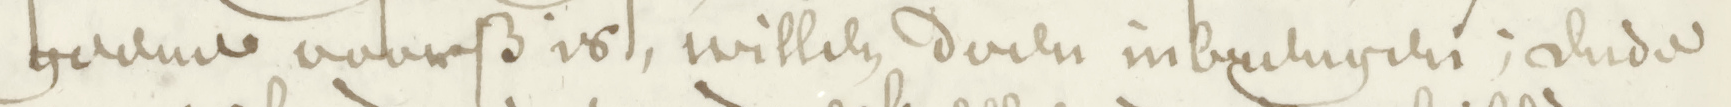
geene voors is, willen doen inbrengen; ende
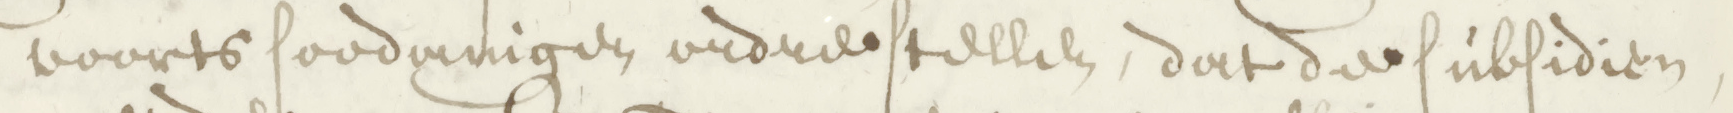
voorts soodanigen ordre stellen, dat de subsidien
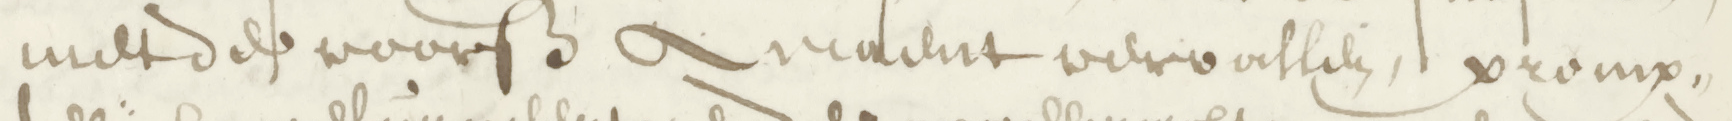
met de voors maent vervallen, promp„
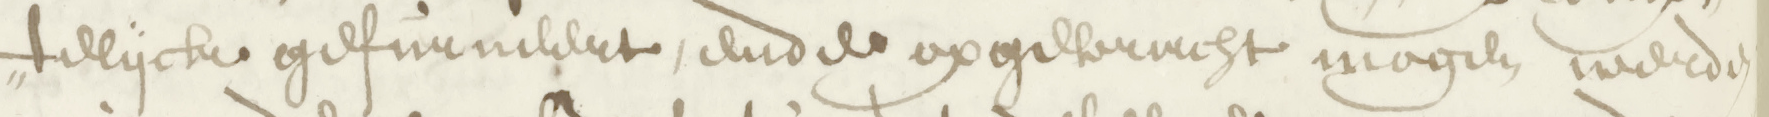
,,telijck gefurneert, ende opgebracht mogen werden
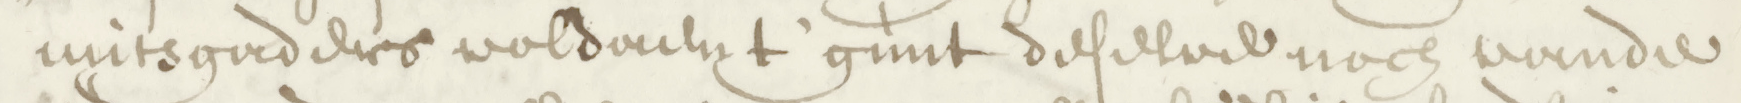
mitsgaders voldaen t' gunt deselve noch vande
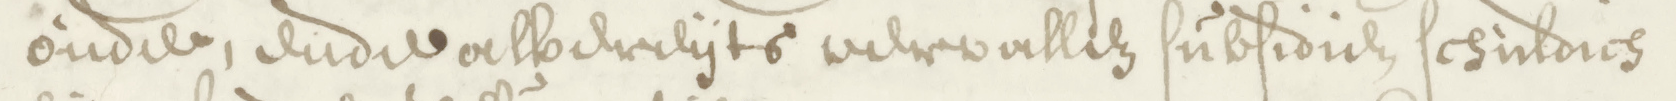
oude, ende albereijts vervallen subsidien schuldich
